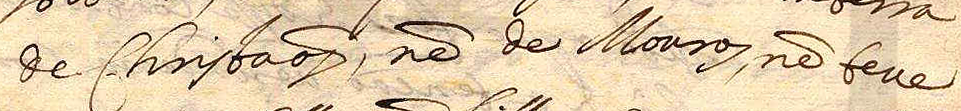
de Christaõs, nē de Mouros, nē teue
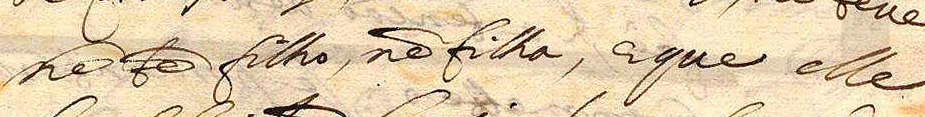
neste filho, nē filha, E que elle
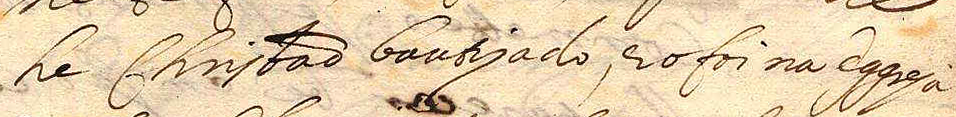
he Christão bautizado, E o foi na eggreja
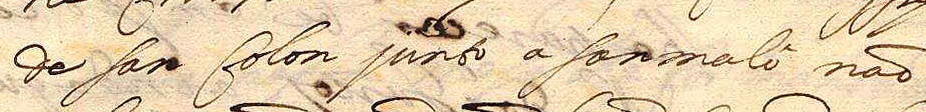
de San Colon junto a San maló não
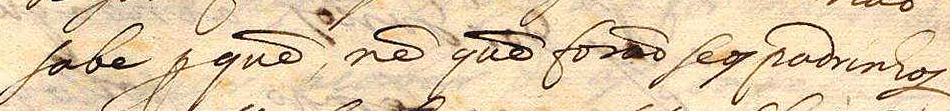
sabe o quē, nē quē forão seos padrinhos
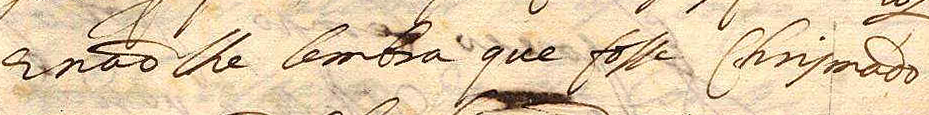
E não lhe lembra que fosse Chrismado
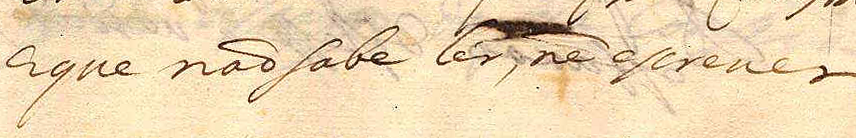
E que naõ sabe ler nē escreuer
